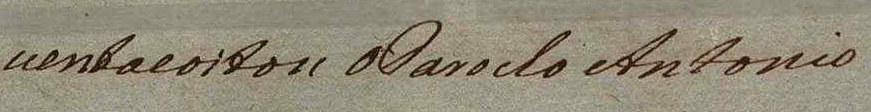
uenta e oito // o Parocho Antonio
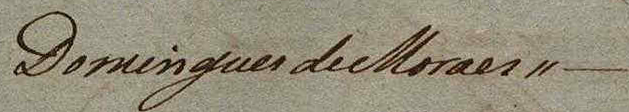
Domingues de Moraes //
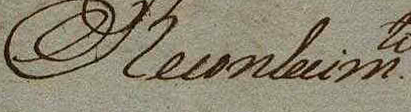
Reconhecim.to
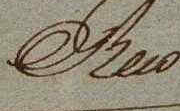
Reco
